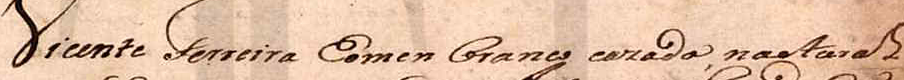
Vicente Ferreira homen branco cazado, natural
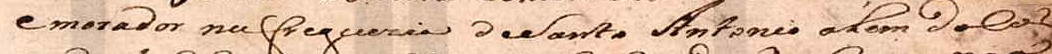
e morador na freguezia de Santo Antonio aLem do Car
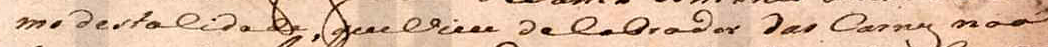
mo desta Cidade, que viue de Cobrador das Carnes no a
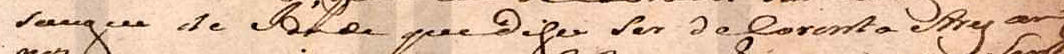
sougue de Idade que diser ser de Corenta e tres an
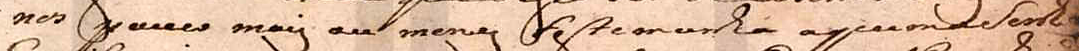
nos pouco mais ou menos testemunha a quem o Senh
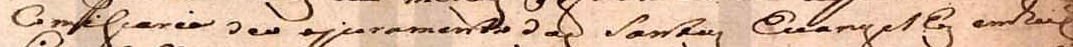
comissario deo o juramento dos Santos Euangalhoz em hu
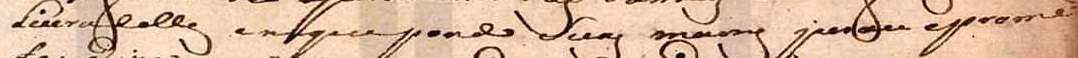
Liuro delle en que pondo suas maons jurou e prome
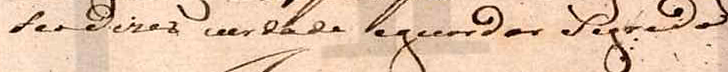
teo dizer uerdade e guardar Segredo
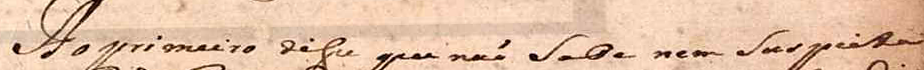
Ao primeiro disse que naõ sabe nem suspeita
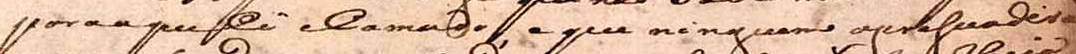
para o que hé chamado, e que ninguem o presuadira
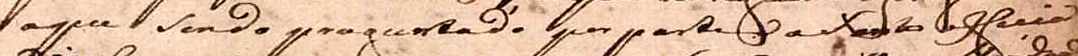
a que sendo proguntado por parte da Santo offecio
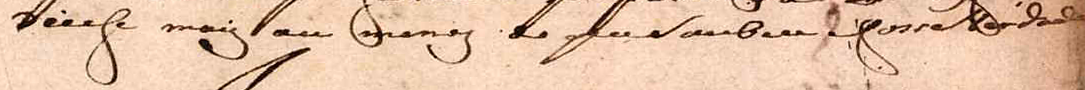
dicese mais ou menoz do que soubece e fosse verdade
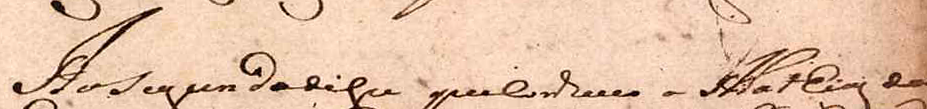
Ao segundo disse que conheceo a Mathias da
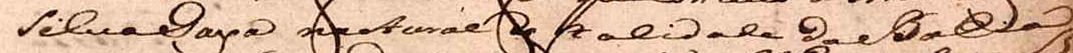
silua Gaya natural desta cidade da Bahia
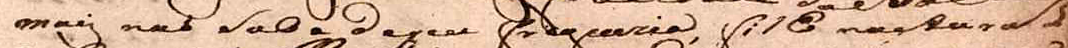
mais naõ sabe de que freguezia, filho natural
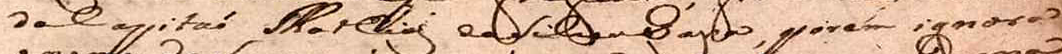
do Capitaõ Mathias da Silua Gaya, porem ignora
